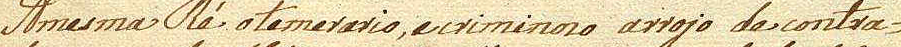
A mesma Ré o temerario, e criminozo arrojo de contra
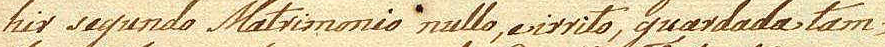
hir segundo Matrimonio nullo, e irrito, guardada tam
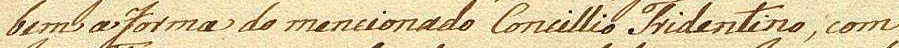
bem a forma do mencionado Concillio Tridentino, com
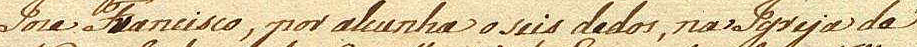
Ioze Francisco, por alcunha o seis dedos, na Igreja de
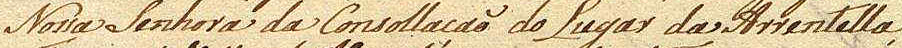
Nossa Senhora da Consollaçaõ do Lugar da Arrentella,
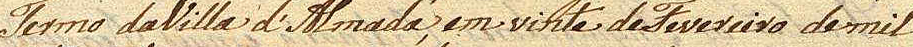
Termo da Villa d'Almada, em vinte de Fevereiro de mil
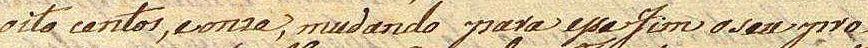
oito centos, e onze, mudando para esse fim o seu pro
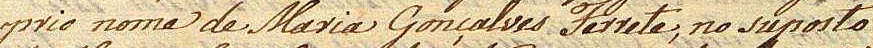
prio nome de Maria Gonçalves Ferrete, no suposto
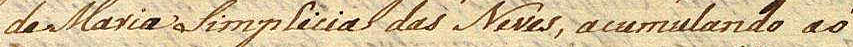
de Maria Simplicia das Neves, acumulando aõ
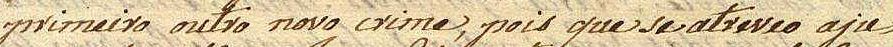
primeiro outro novo crime, pois que se atreveu a ju
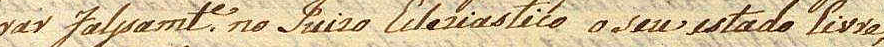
rar falsamt.e no Iuizo Ecleziastico o seu estado livre,
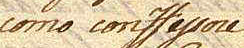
como conffessou
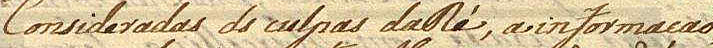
Consideradas de culpas da Ré, a informaçaõ,
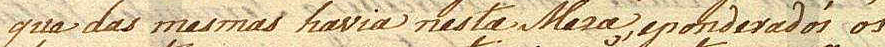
que das mesmas havia nesta Meza, e ponderados os
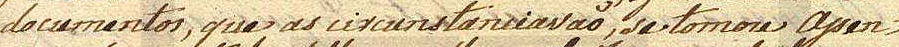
documentos, que as circunstanciavaõ, se tomou assen
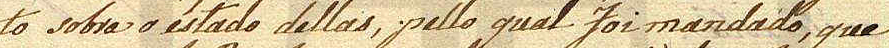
to sobre o estado dellas, pello qual foi mandado, que
